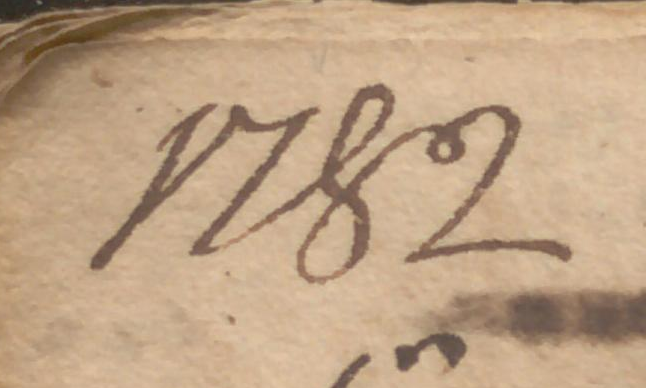1782
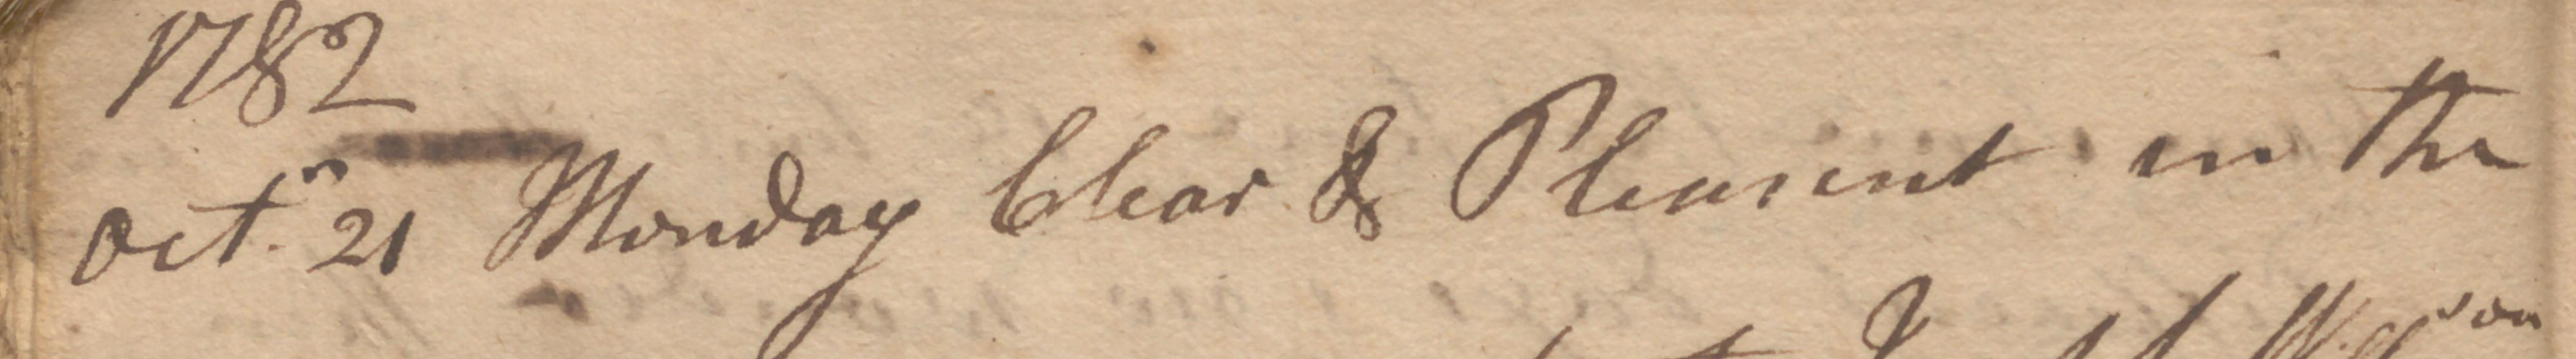Oct^r. 21 Monday Clear & Pleasent in the
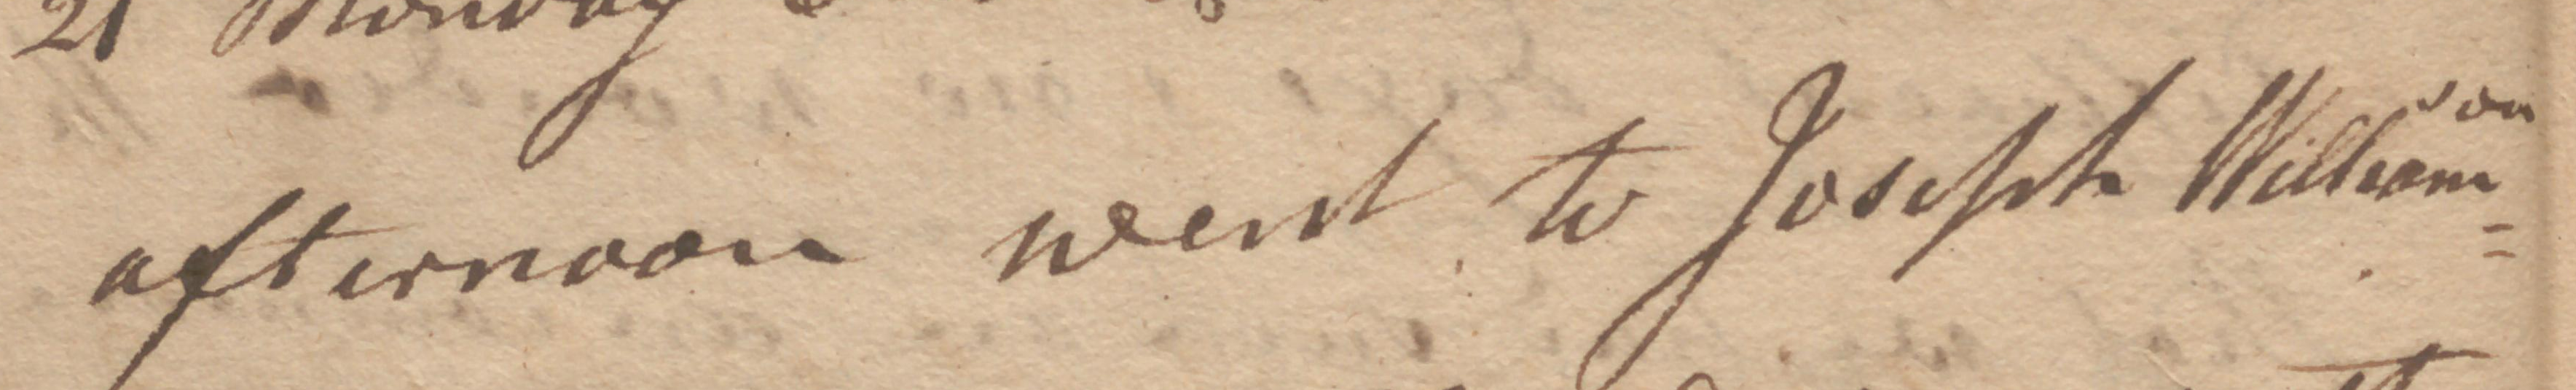afternoon went to Joseph William^son
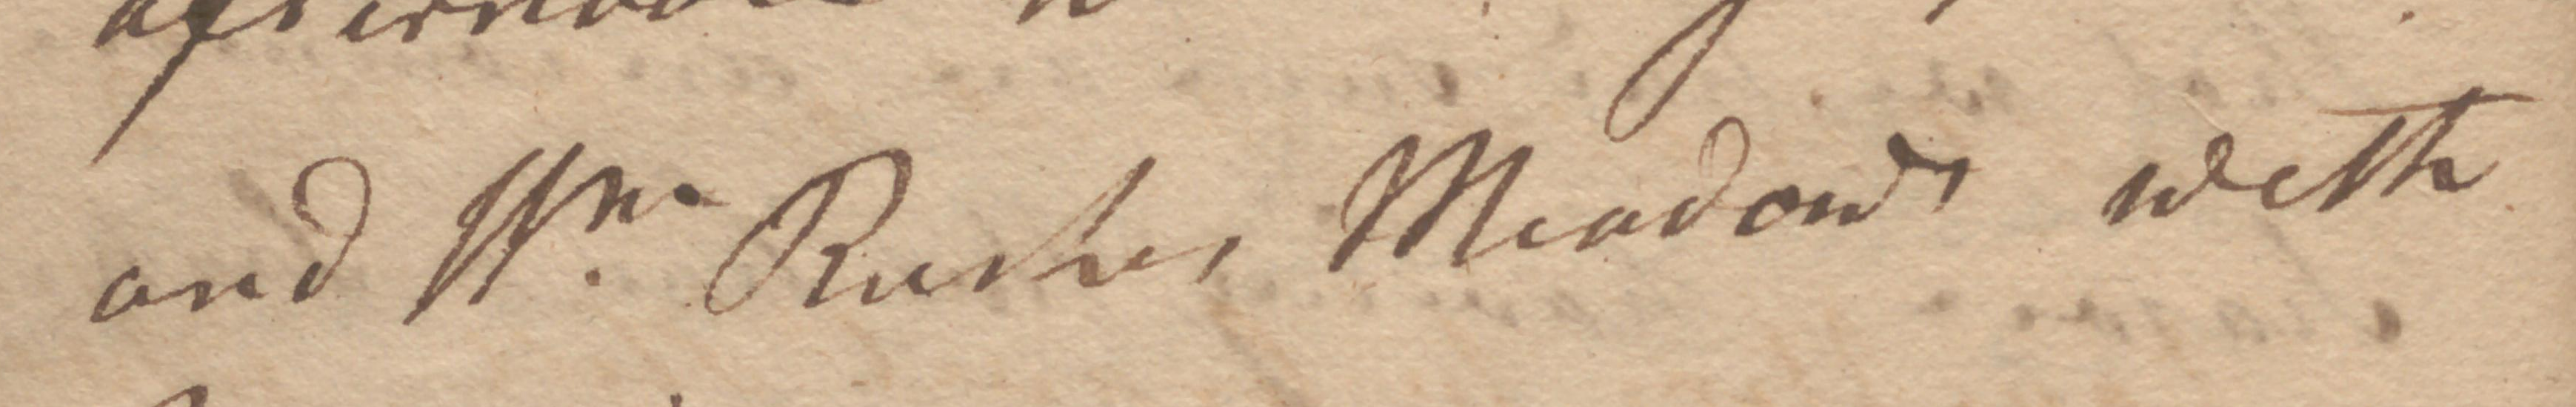and W^m. Rushes Meadows with
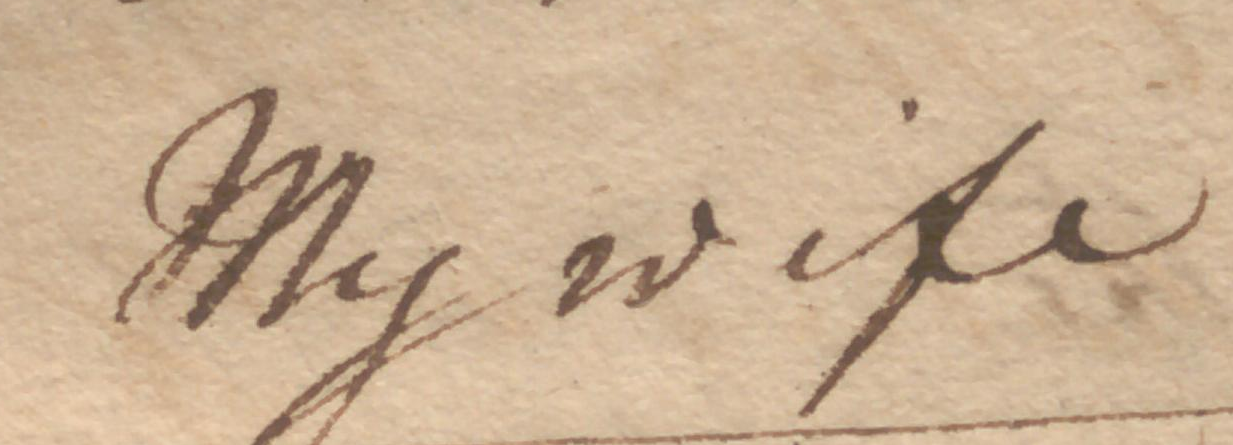My wife
